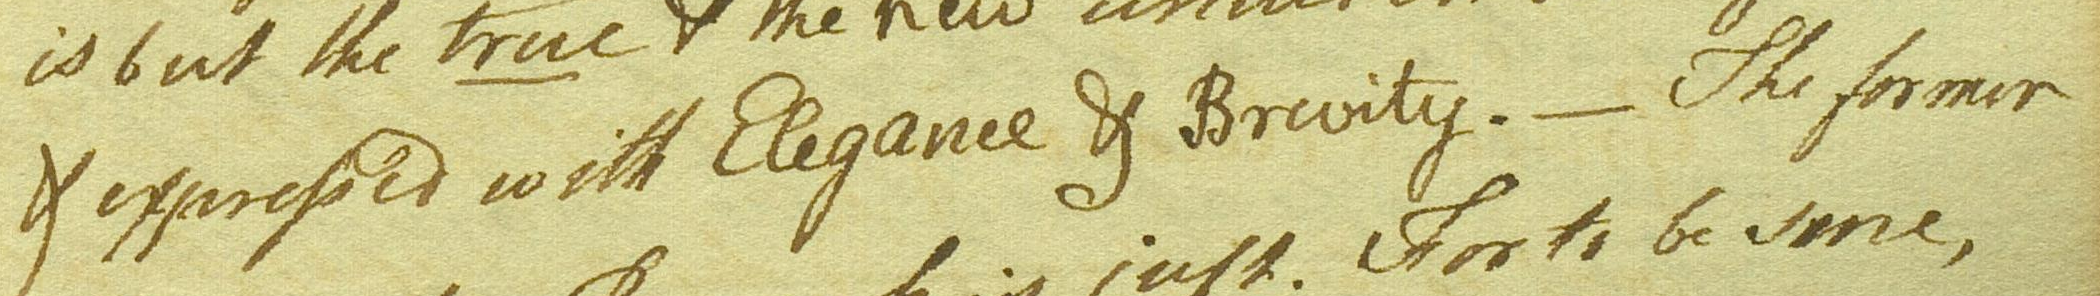& expressed with Elegance & Brevity.- The former
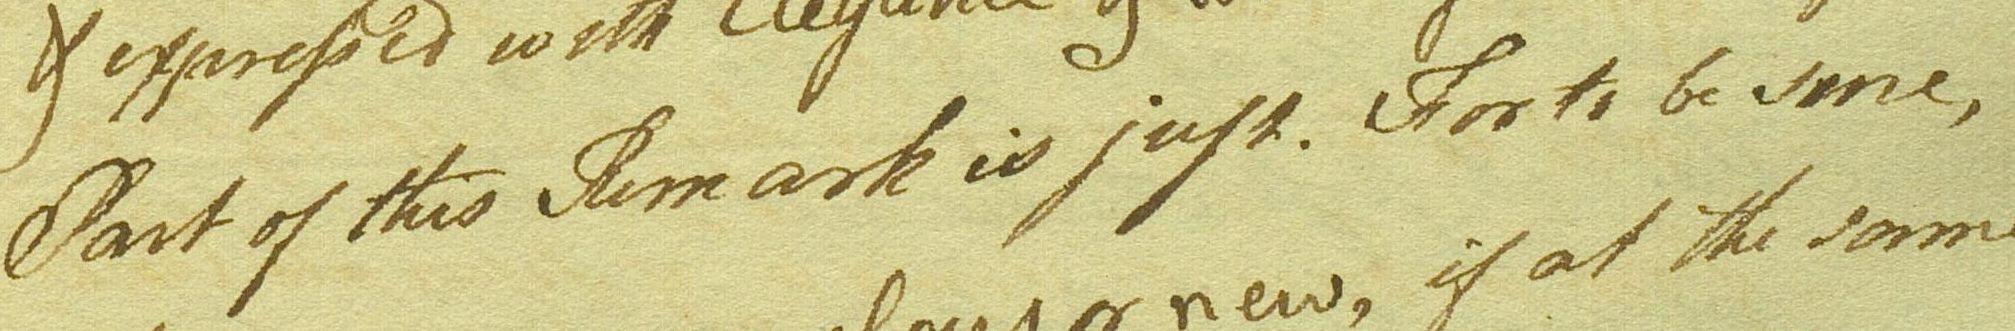Part of this Remark is just. For to be sure,
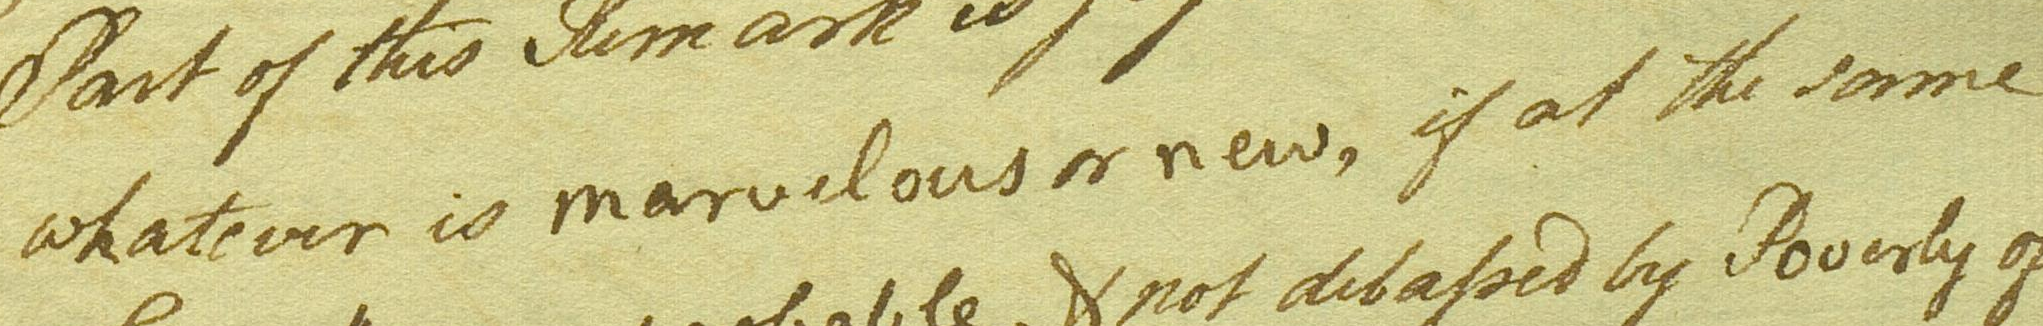whatever is marvelous or new, if at the same
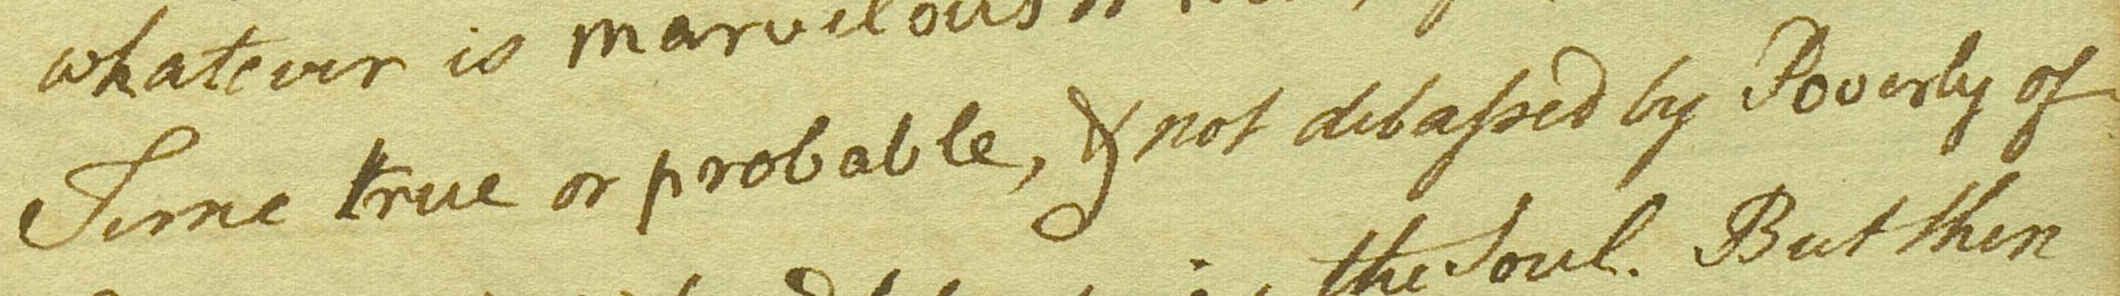Time true or probable, & not debased by Poverty of
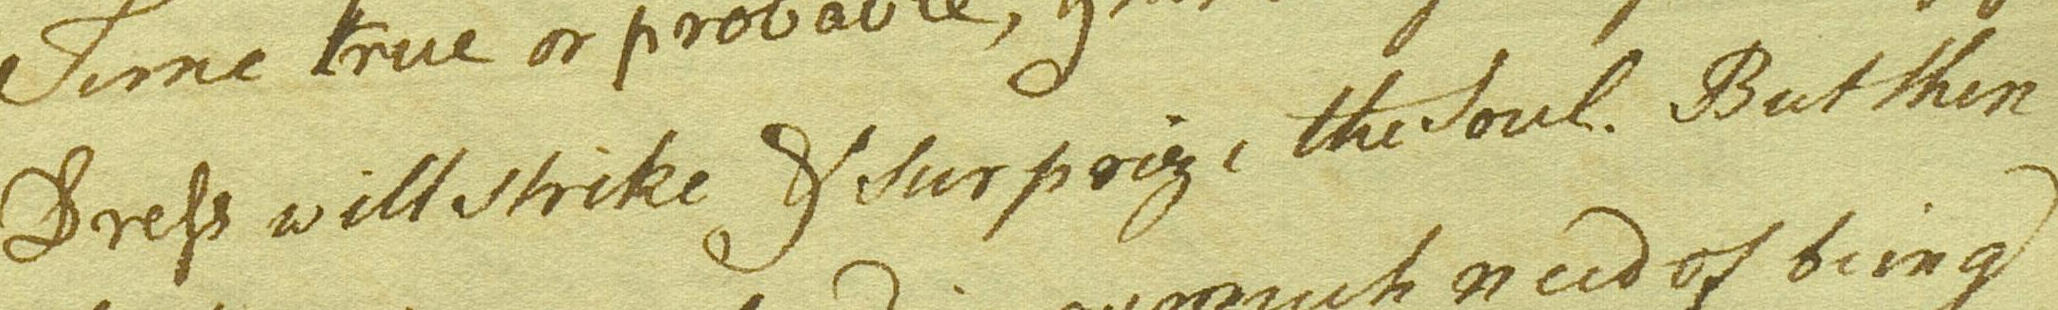Dress will strike & surprize, the Soul. But then
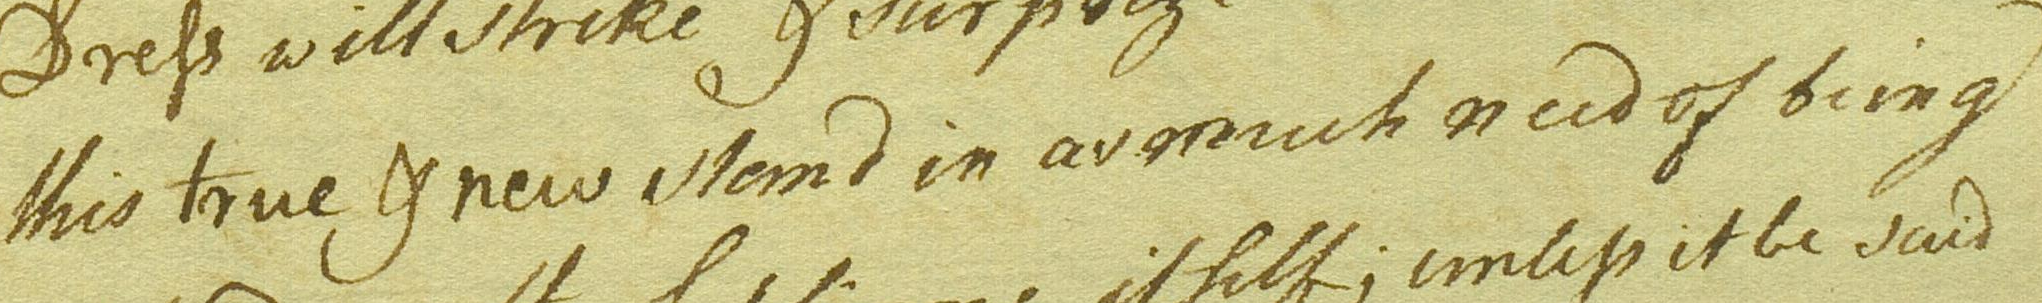this true & new stand in as much need of being
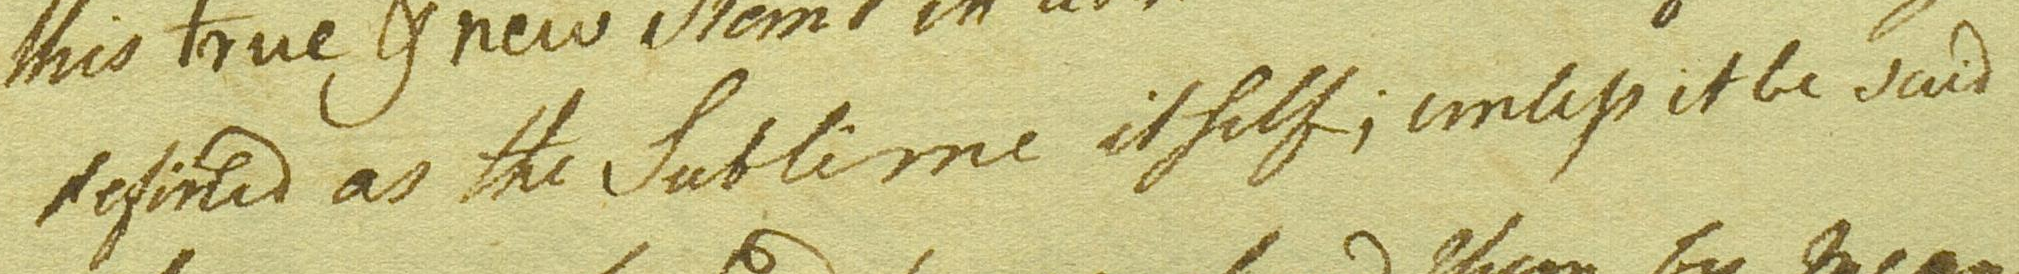defined as the Sublime itself; unless it be said
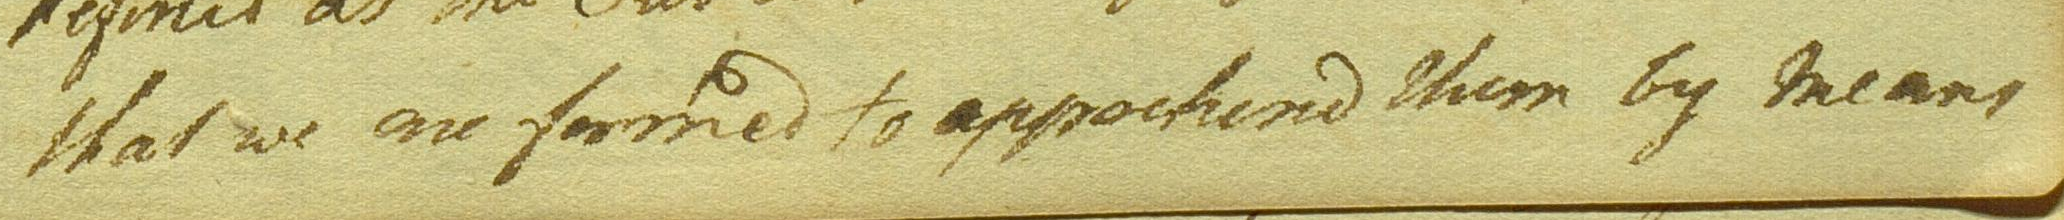that we are formed to apprehend them by means
